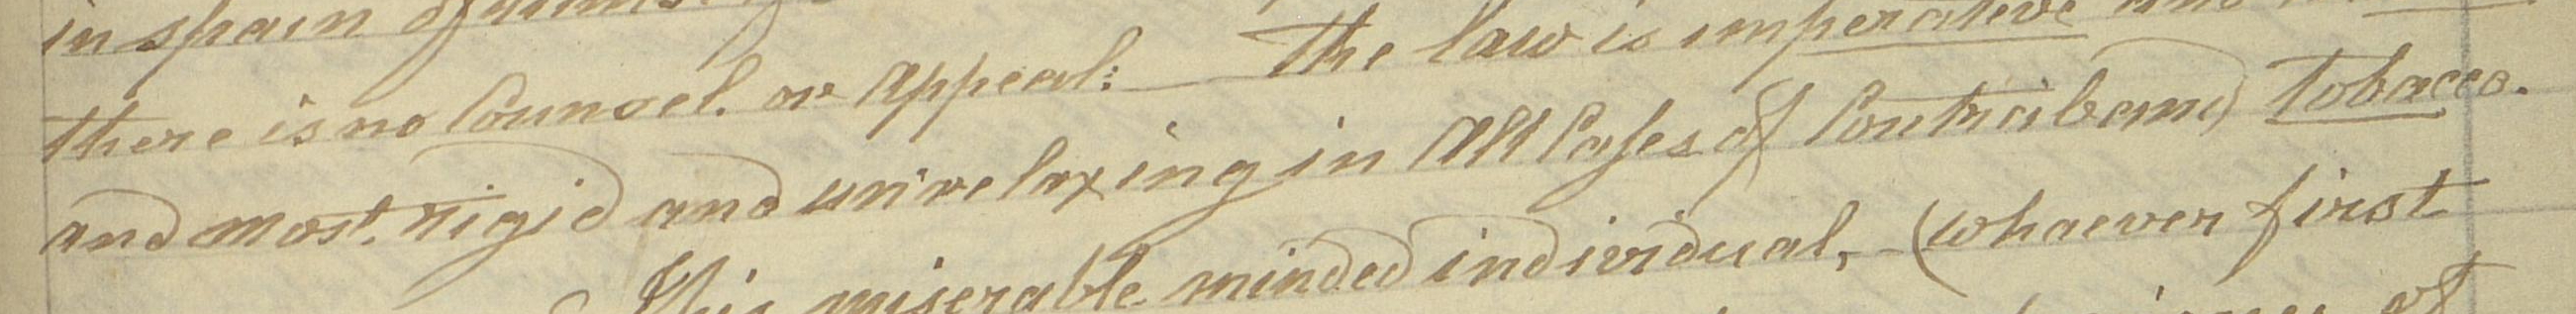and most rigid and unrelaxing in All Cases of Contraband tobacco.
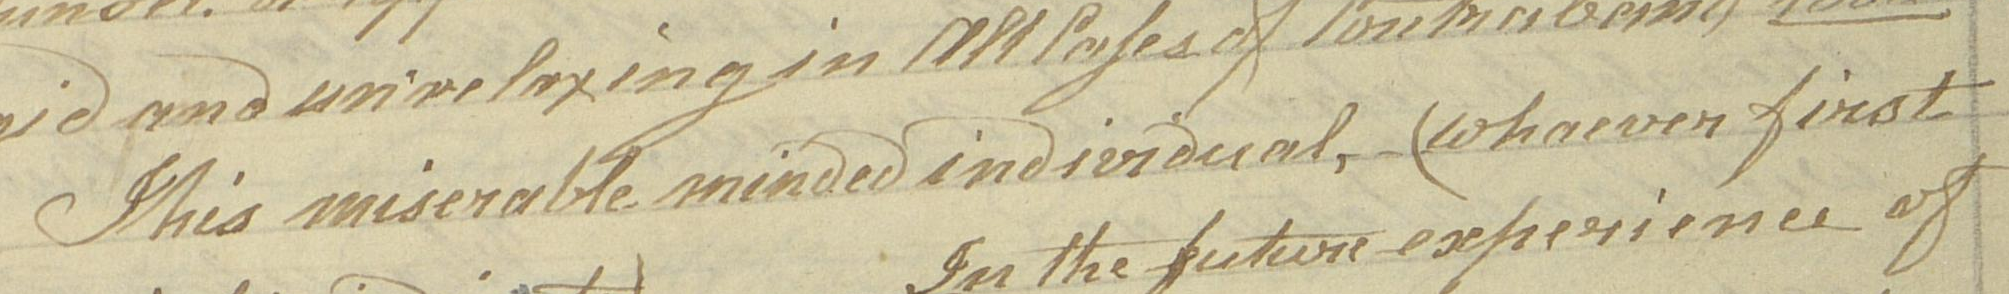This miserable minded individual (Whoever first
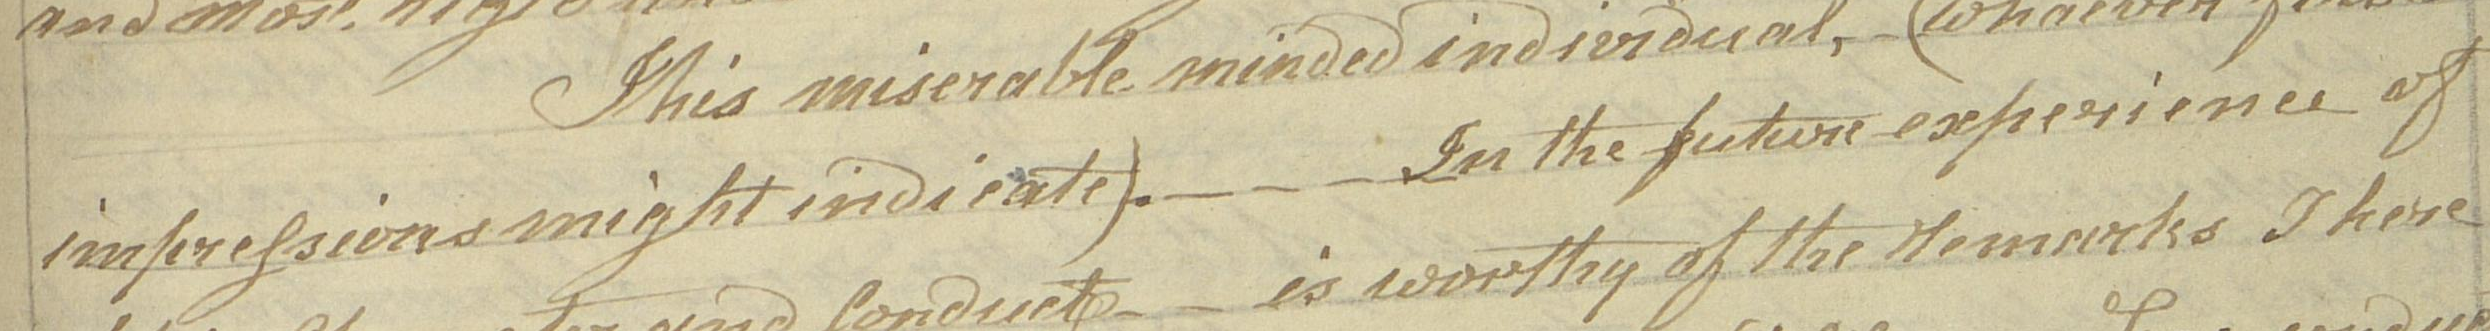impressions might indicate). In the future experience of
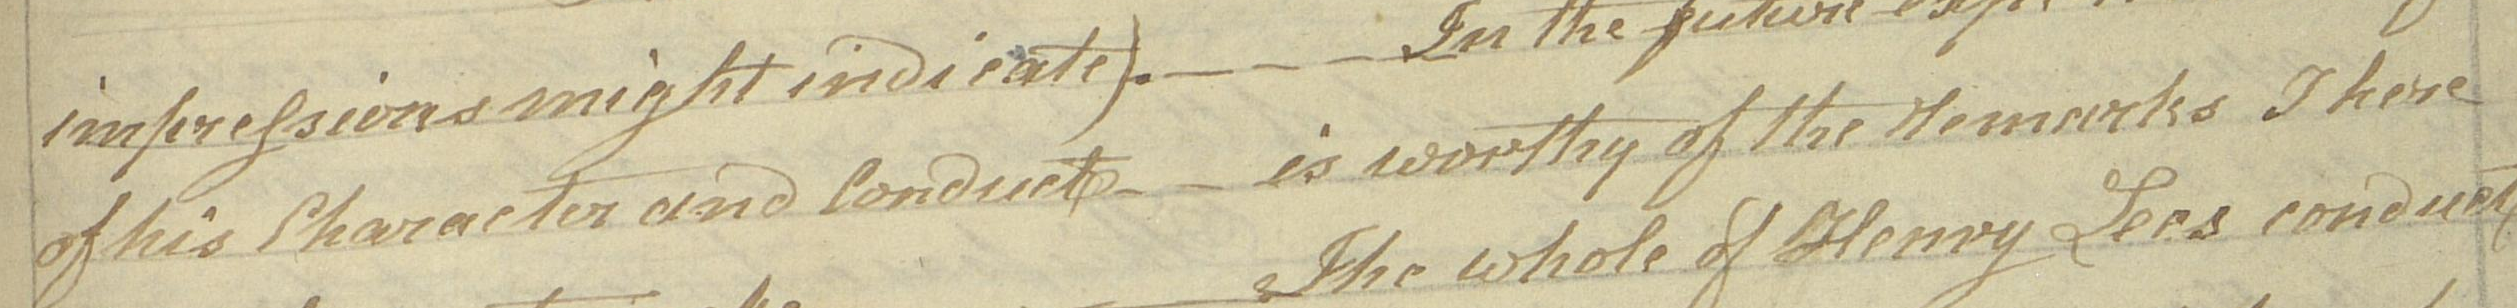of his Character and Conduct is worthy of the Remarks I here
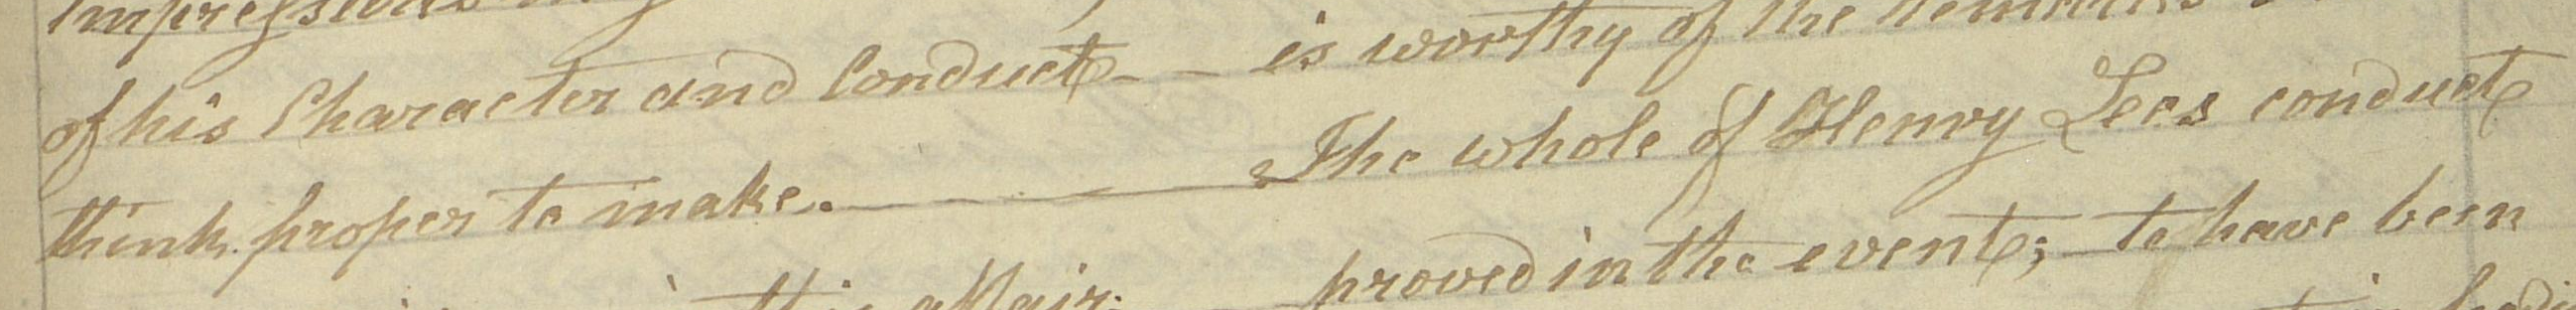think proper to make. The whole of Henry Lees conduct
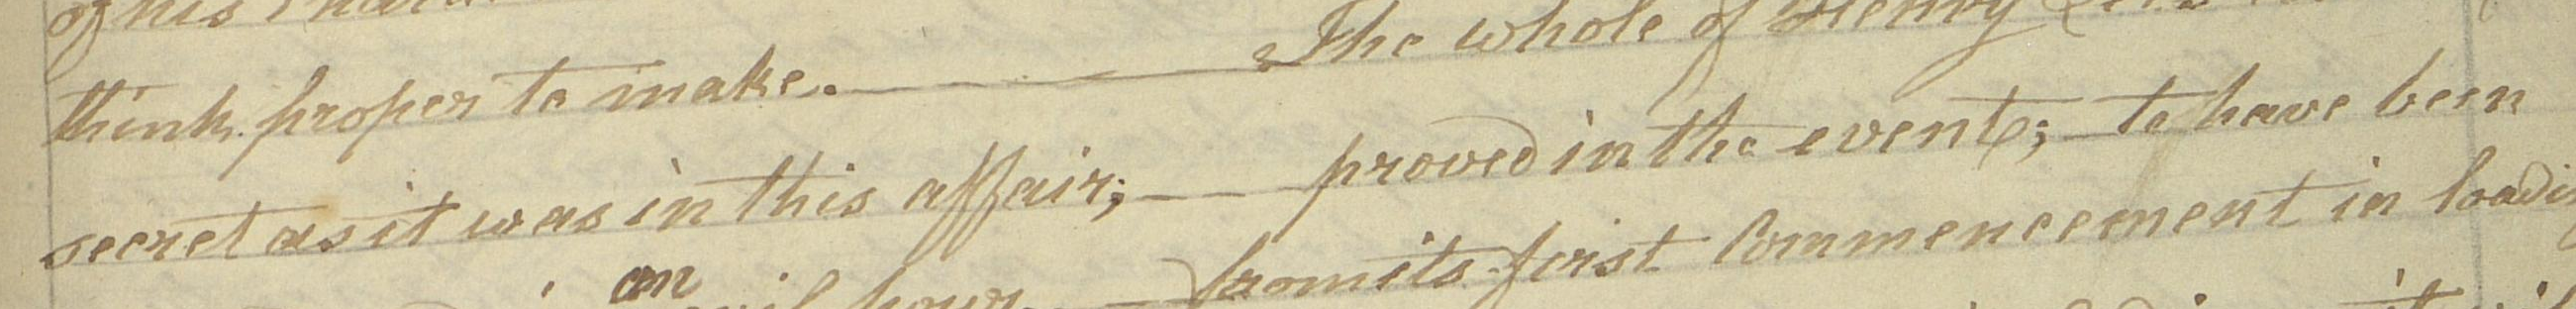secret as it was in this affair; proved in the event; to have been
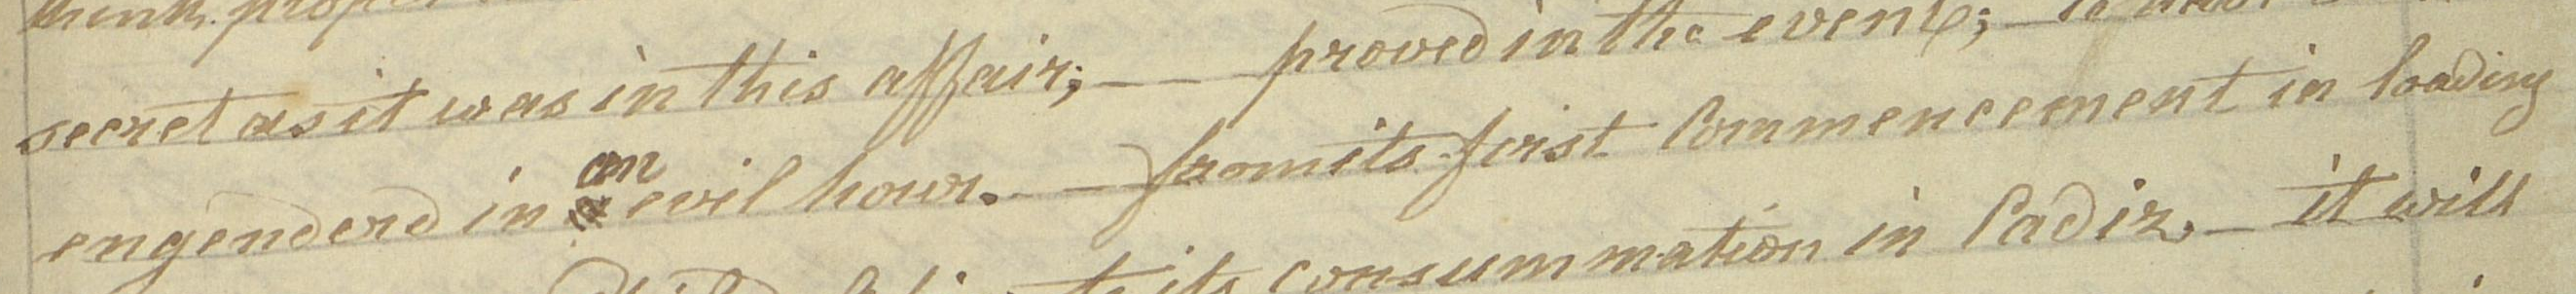engenderd in ^ evil hour. foomils first Commencement in loading
